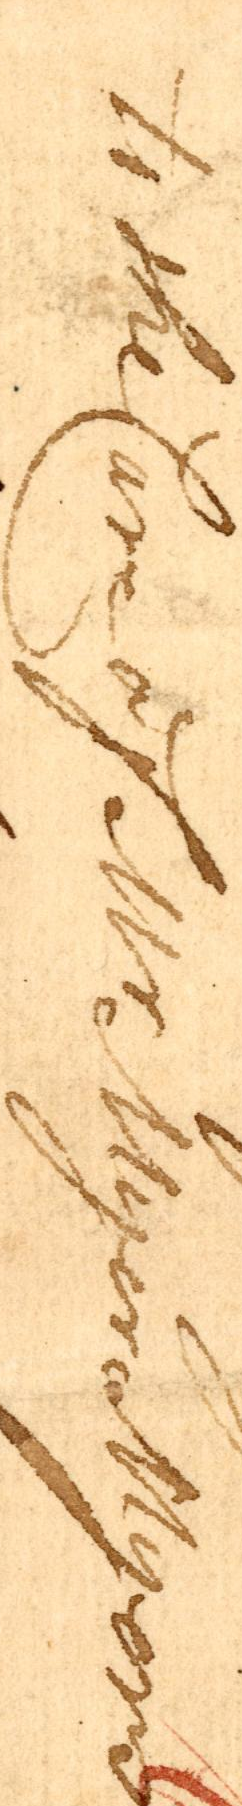To the Care of M^r Myer Myers
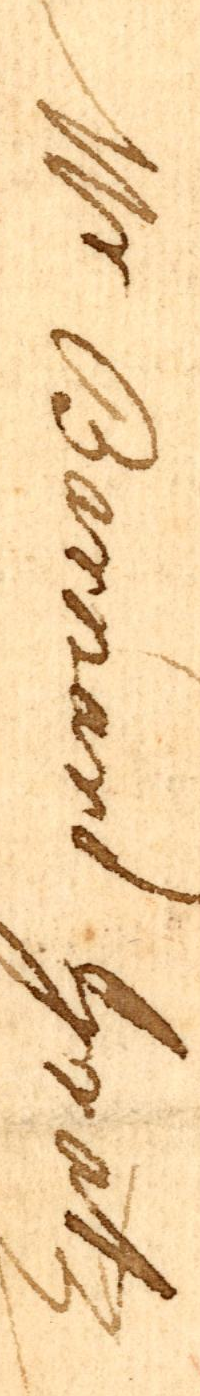M^r Barnard Gratz
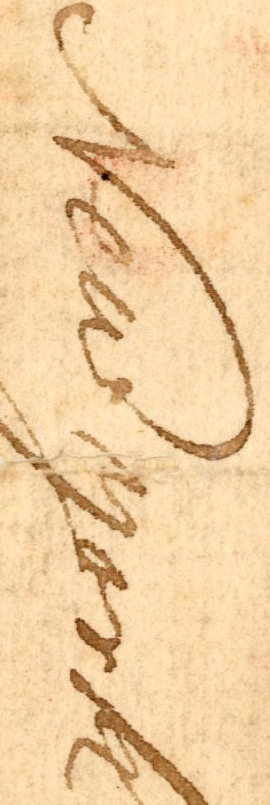New York
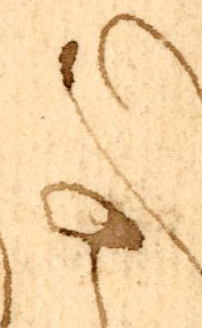To
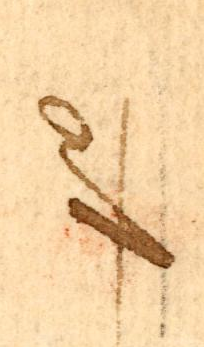at
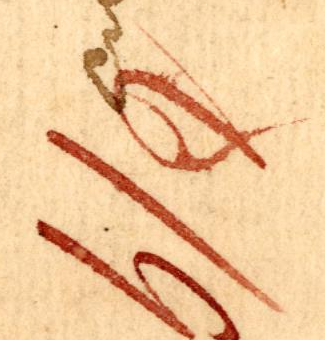6s9
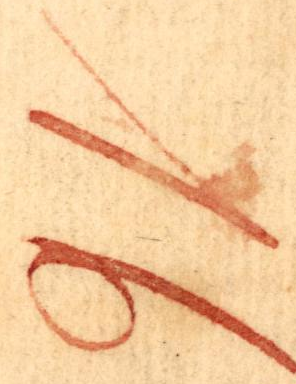16
